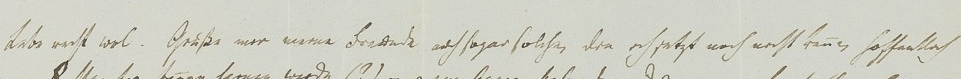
Lebe recht wol. Grüße mir meine Freunde auch sogar solche, die ich jetzt noch nicht kenne, hoffentlich
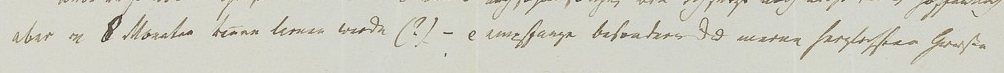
aber in 8 Monaten kennn lernen werde (?) – & empfange besonders Du meine herzlichsten Grüße
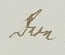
Dein
